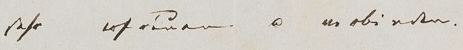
sehr erfreuen & verbinden.
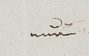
nun
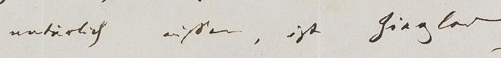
natürlich wissen, ist Ziegler
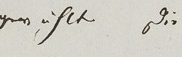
gewählt. Die
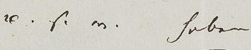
&. s. w. haben
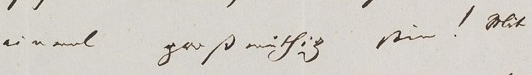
einmal großmüthig sein! Mit
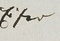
Eifer
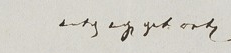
entgegengetreten
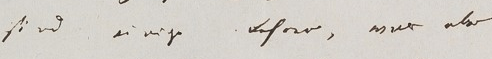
sind einige Lehrer, was aber
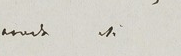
gerade die
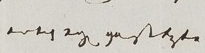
entgegengesetzte
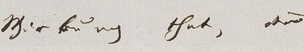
Wirkung that, denn
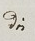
die
